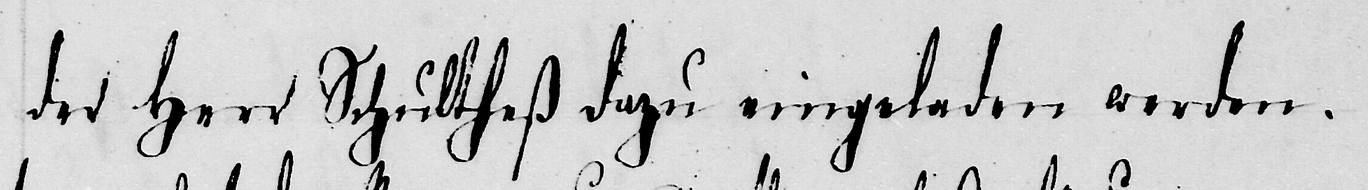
der Herr Schultheß dazu eingeladen werden.
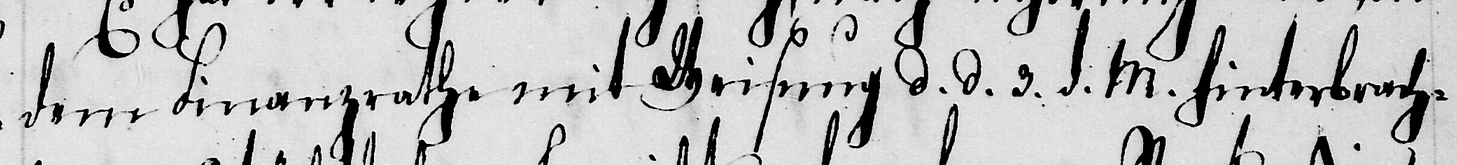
dem Finanzrathe mit Weisung d. d. 3. d. M. hinterbrach¬
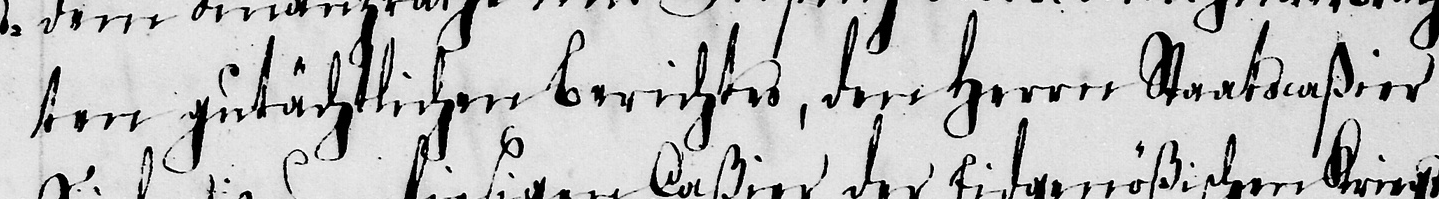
ten gutächtlichen Berichtes, den Herrn Staatscaßier
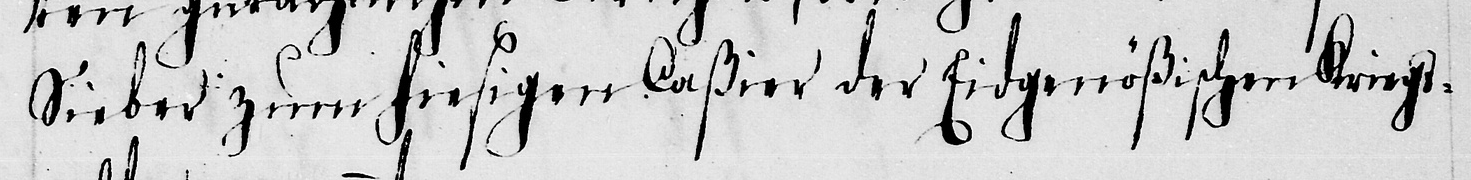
Sieber zum hiesigen Caßier der Eidgenößischen Kriegs¬
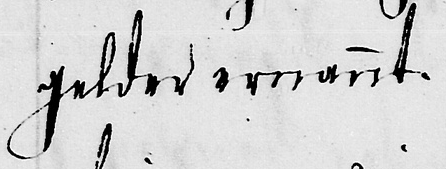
gelder ernannt.
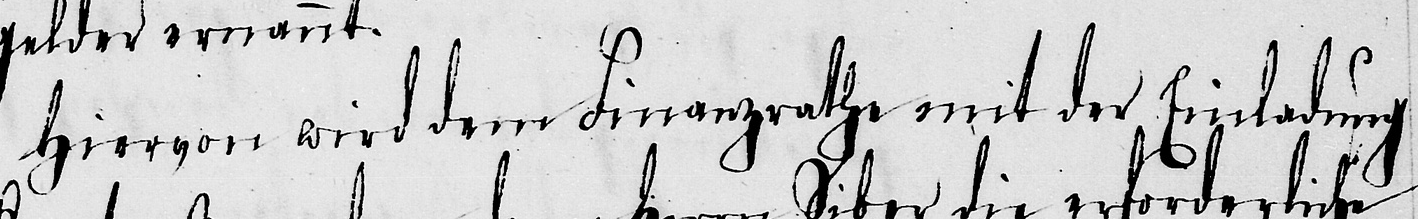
Hiervon wird dem Finanzrathe mit der Einladung
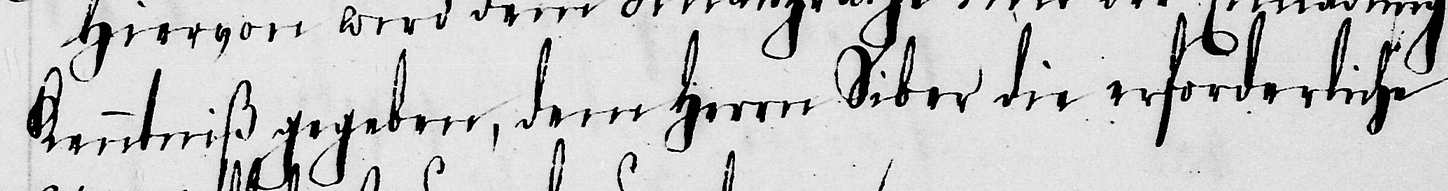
Kenntniß gegeben, dem Herrn Siber die erforderliche
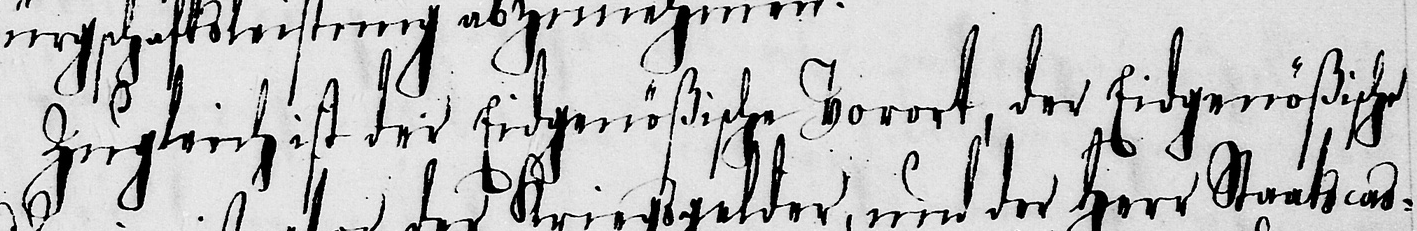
Zugleich ist der Eidgenößische Vorort, der Eidgenößische
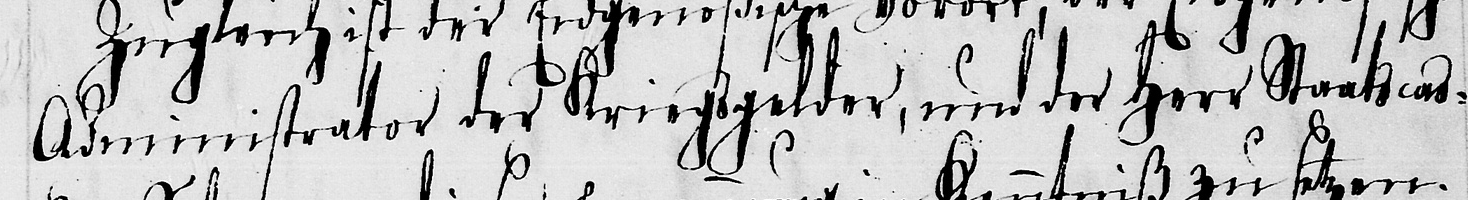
Administrator der Kriegsgelder, und der Herr Staatsca¬
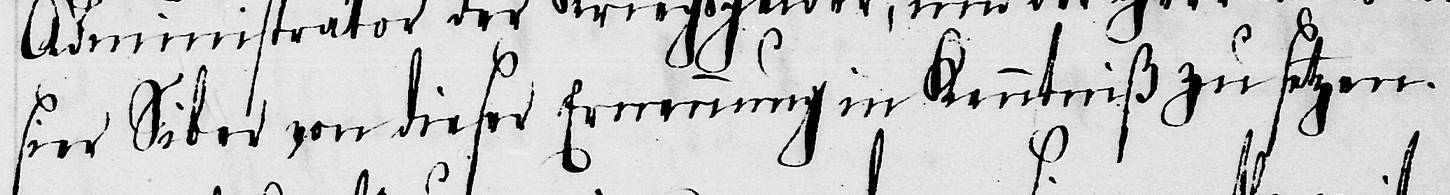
ßier Siber von dieser Ernennung in Kenntniß zu setzen.
